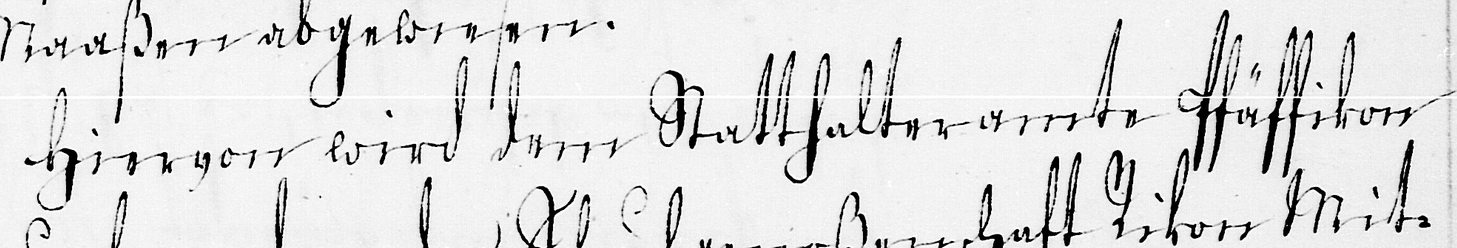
Hiervon wird dem Statthalteramte Pfäffikon
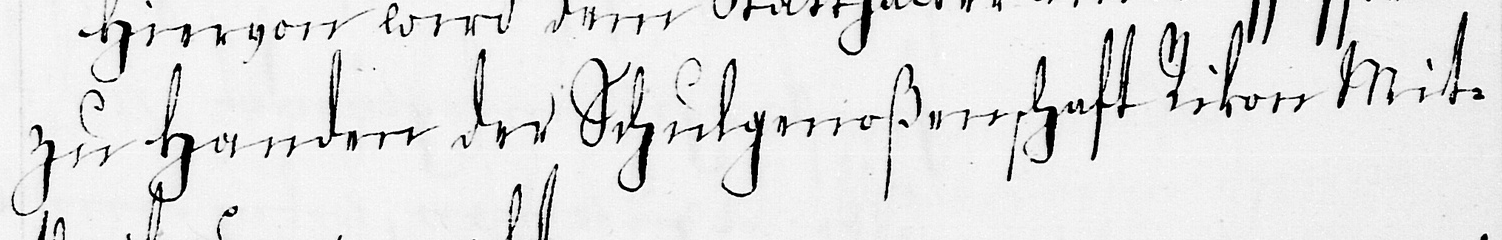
zu Handen der Schulgenoßenschaft Rikon Mit¬
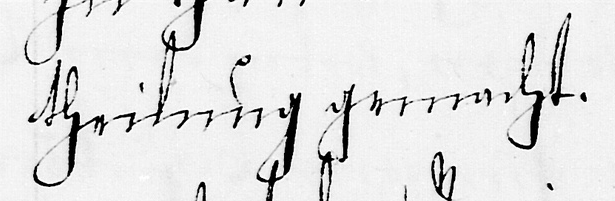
theilung gemacht.
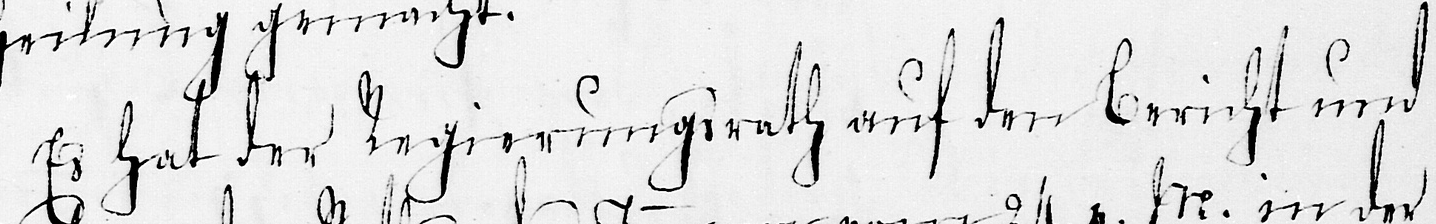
Es hat der Regierungsrath auf den Bericht und
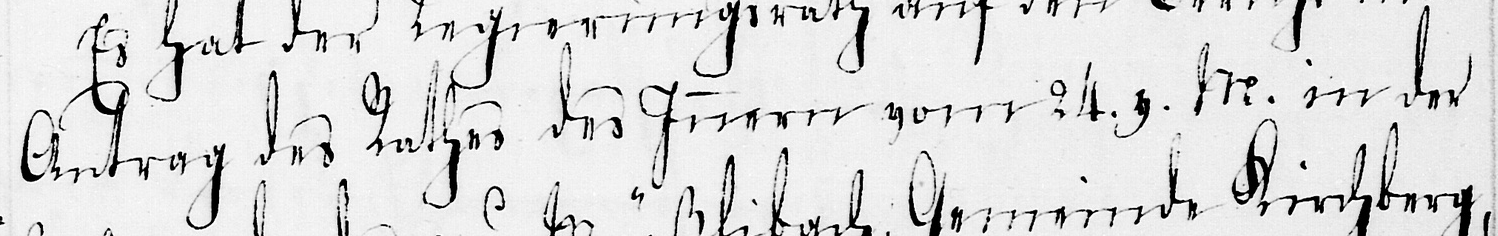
Antrag des Rathes des Innern vom 24. v. M. in der
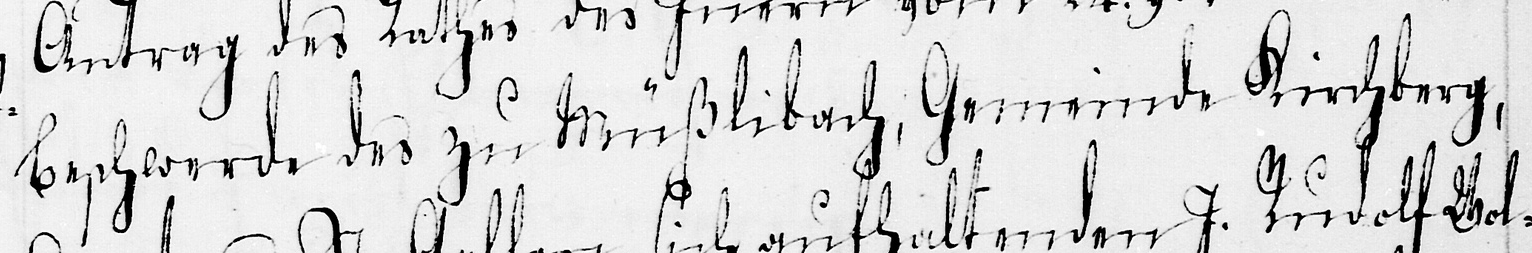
Beschwerde des zu Müßlibach, Gemeinde Kirchberg,
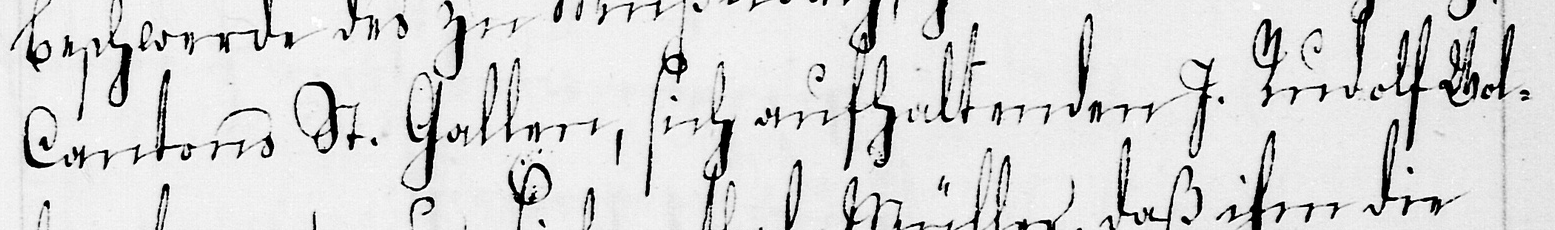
Cantons St. Gallen, sich aufhaltenden J. Rudolf Wol¬
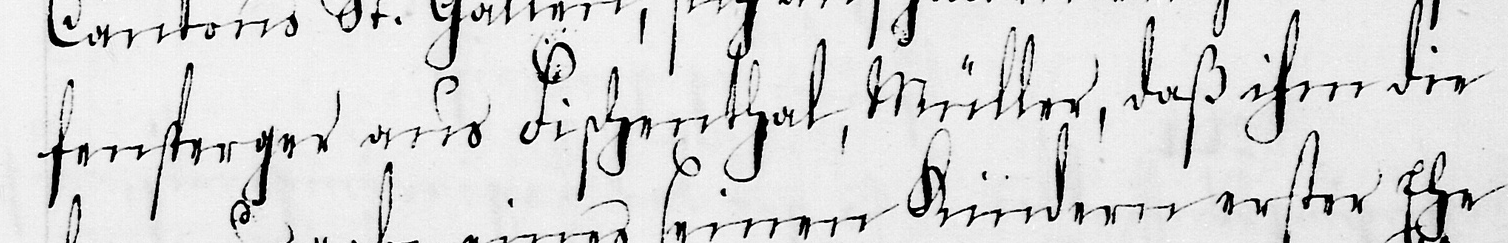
fensperger aus Fischenthal, Müller, daß ihm die
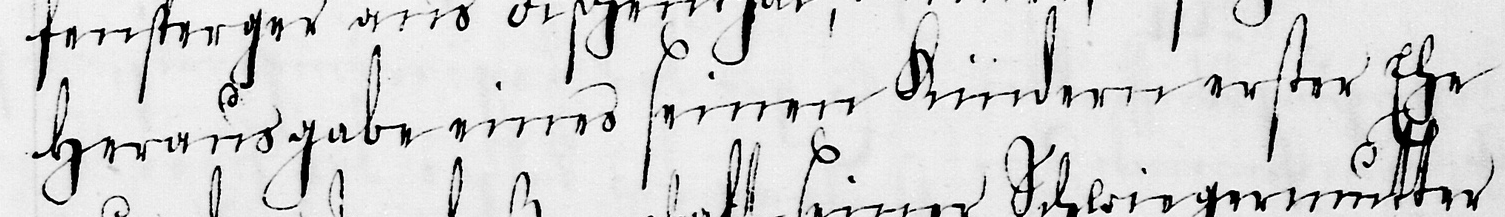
Herausgabe eines seinen Kindern erster Ehe
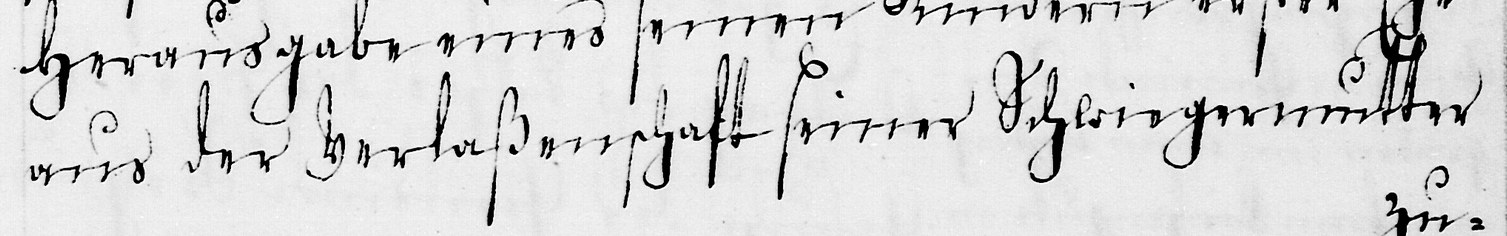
aus der Verlaßenschaft seiner Schwiegermutter
